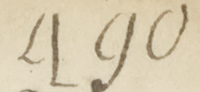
490
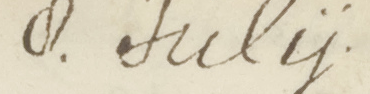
8. Julij.
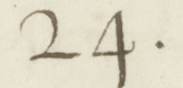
24.
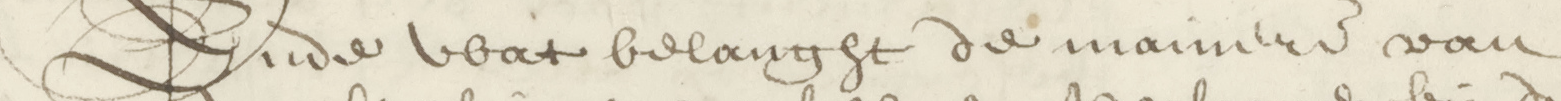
Ende wat belanght de maniere van
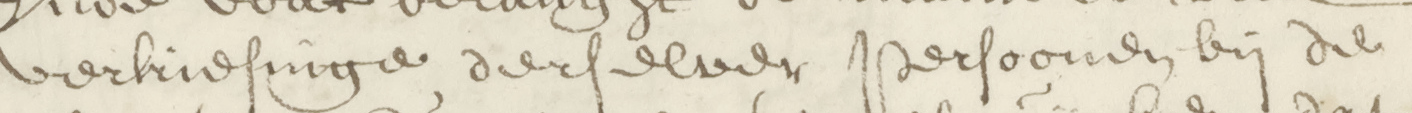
verkiesinge derselver Persoonen bij de
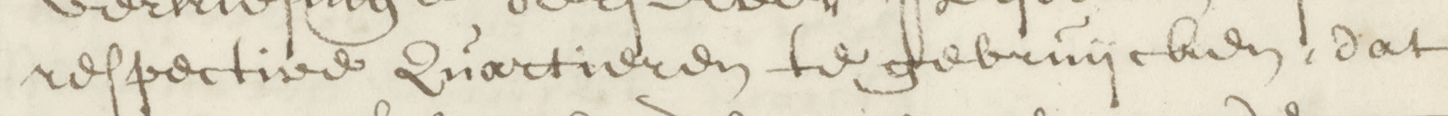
respective Quartieren te gebruijcken, dat
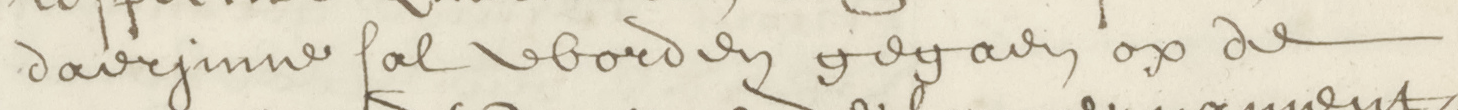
daerinne sal worden gegaen op de
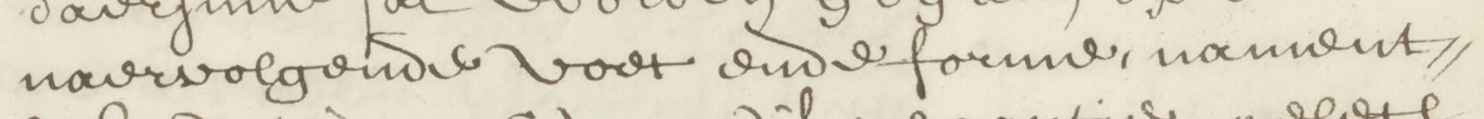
naervolgende voet ende forme, nament„
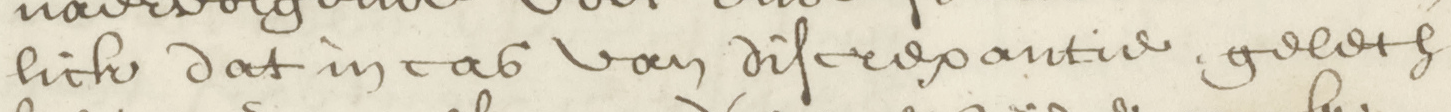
lick dat in cas van discrepantie geleth
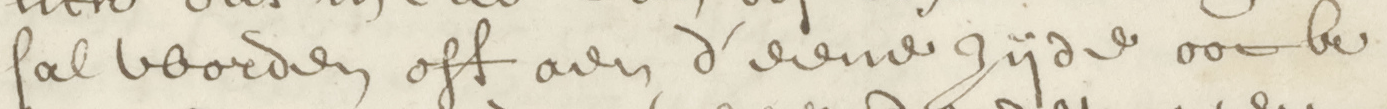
sal worden off aen d‛eene zijde oock
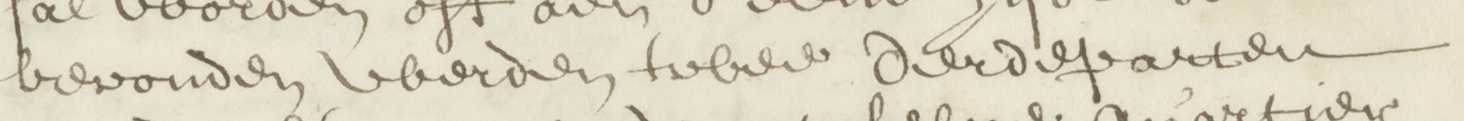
bevonden werden twee derdeparten
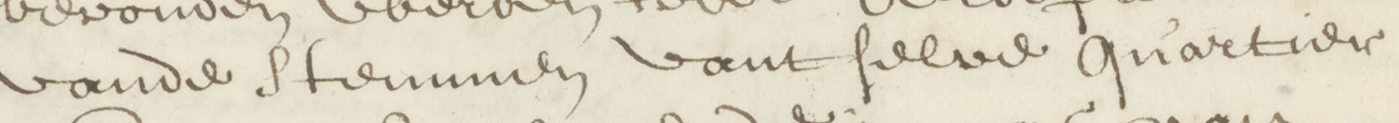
vande Stemmen vant selve Quartier
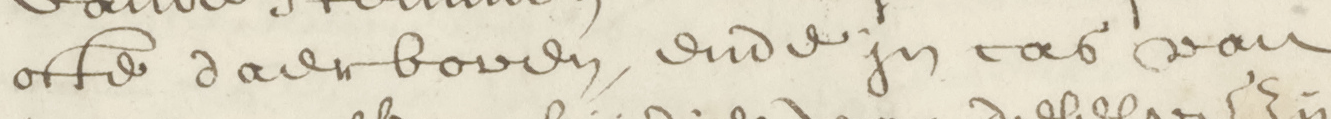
ofte daerboven, ende in cas van
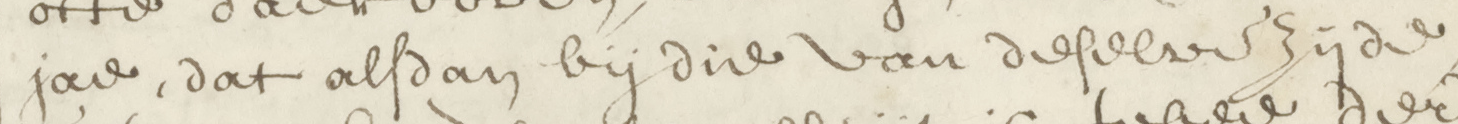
jae, dat alsdan bij die van deselve zijde
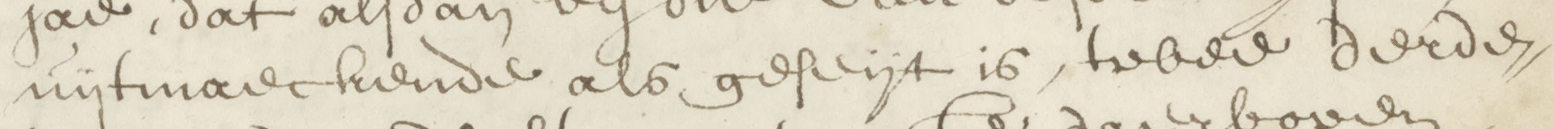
uijtmaeckende als geseijt is, twee derde„
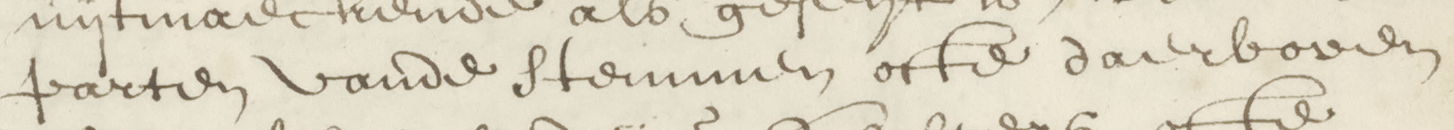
parten vande Stemmen ofte daerboven,
